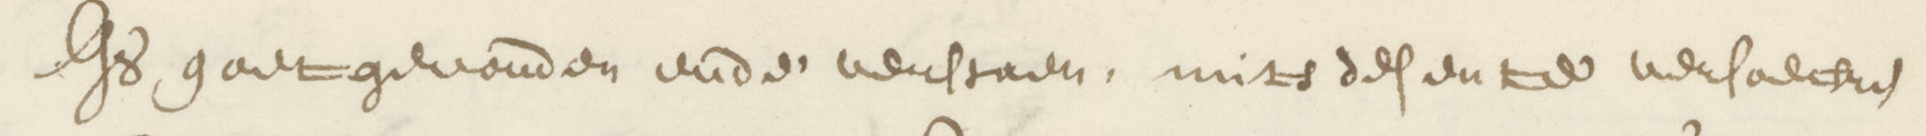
Is goetgevonden ende verstaen, mits desen te versoecken
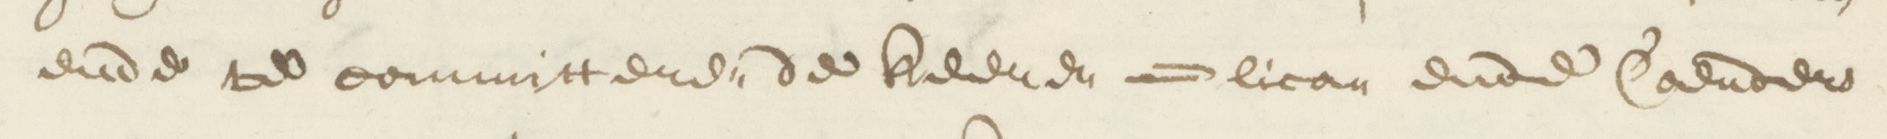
ende te committeren de heeren Olican ende Coenders
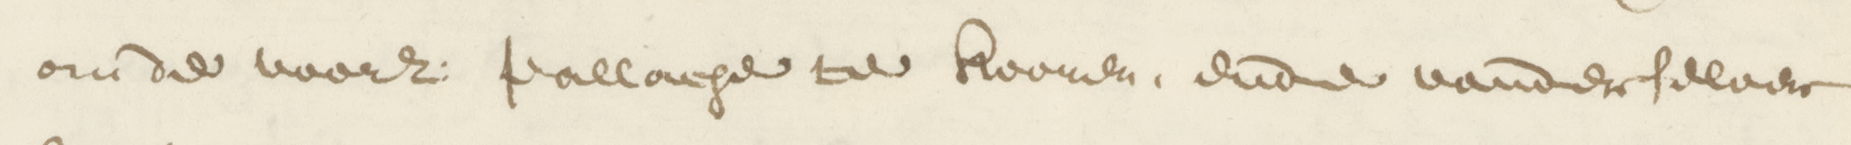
om de voorz: Pallache te hooren ende van derselver
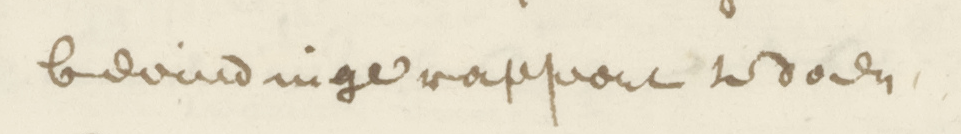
bevindinge rapport te doen.
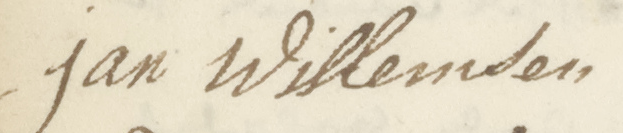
Jan Willemsen
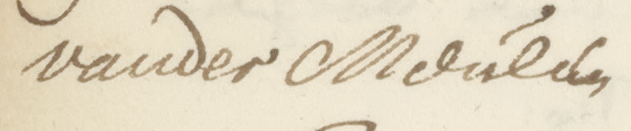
vander Meulen
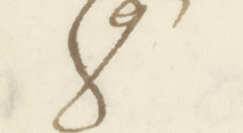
Ca
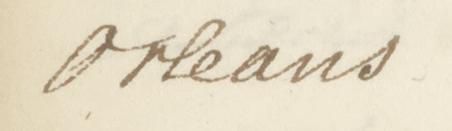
Orleans
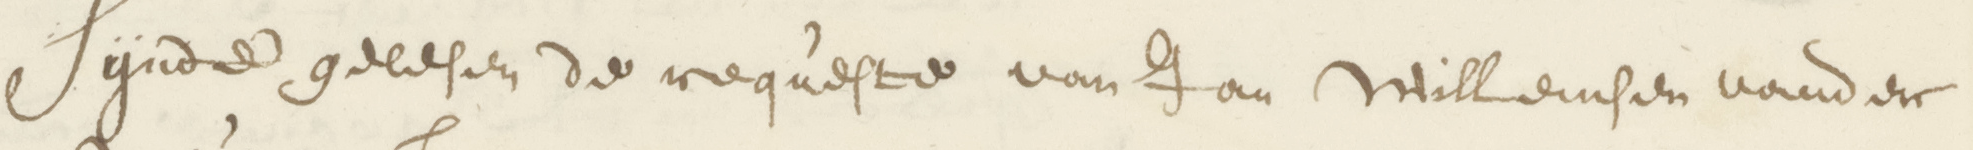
Sijnde gelesen de requeste van Jan Willemsen vander
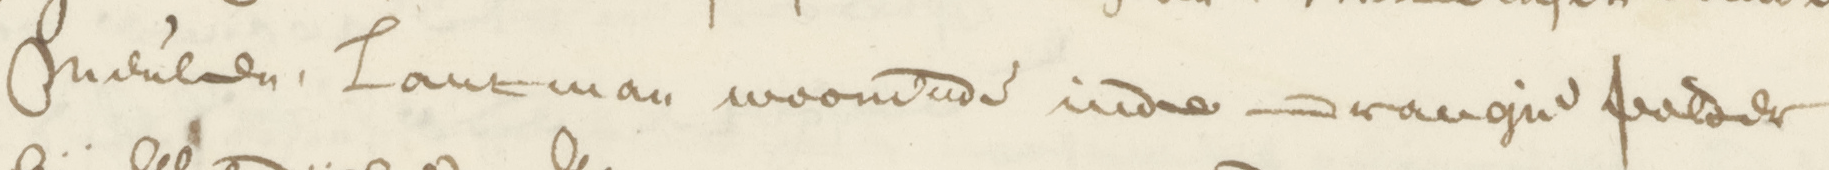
Meulen, lantman woonende inde Orangie polder
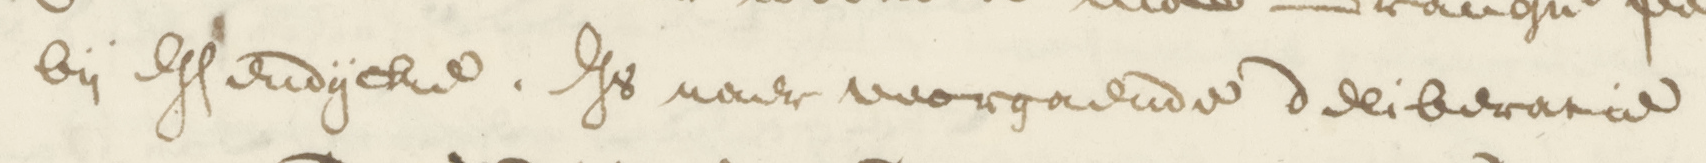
bij Isendijcke. Is naer voorgaende deliberatie
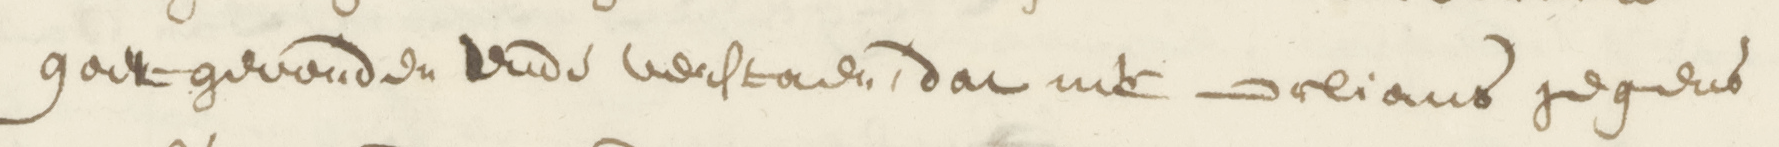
goetgevonden ende verstaen, dat mr. Orlians jegens
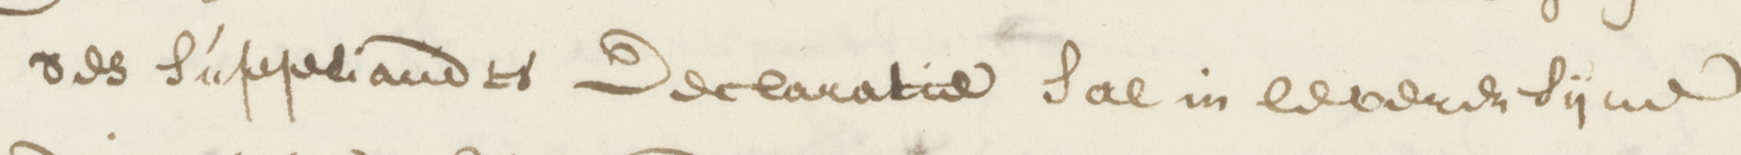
des suppliandts declaratie sal in leveren sijne
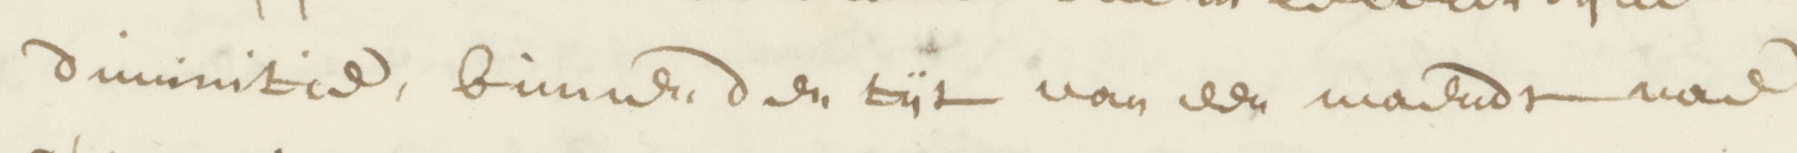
dimunitie, binnen den tijt van een maendt nae
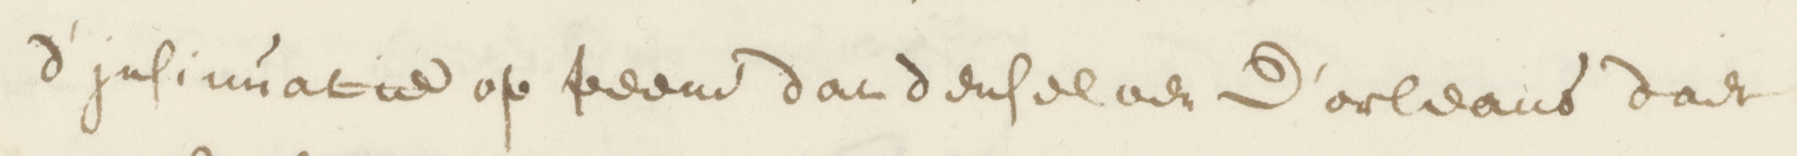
d'insinuatie op peene dat denselven D'orleans daer
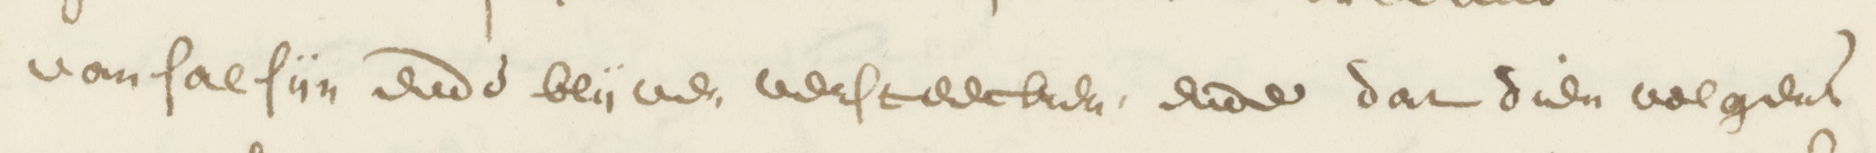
van sal sijn ende blijven versteecken, ende dat dien volgens
